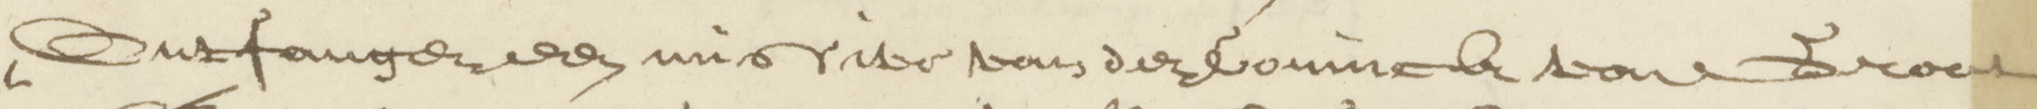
Ontfangen een missive van der Coninck van Groot
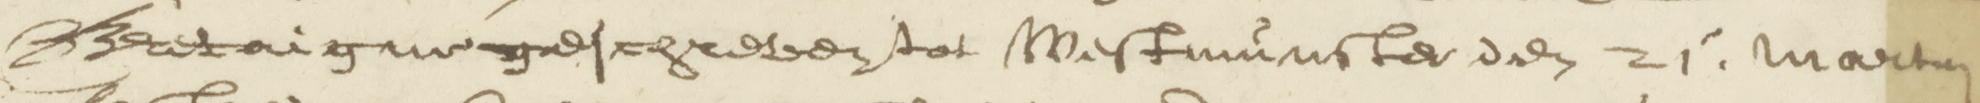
Bretaigne geschreven tot Westmunster den 21e marty
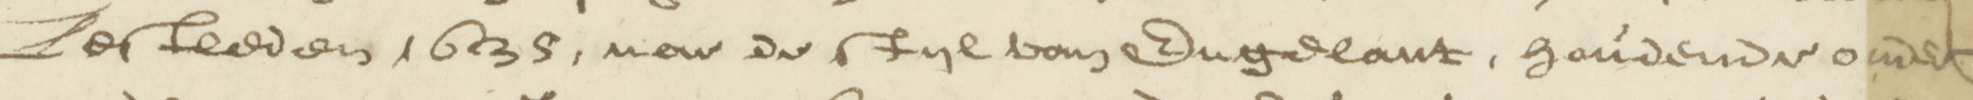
lestleden 1635, nae de styl van Engelant, houdende onder
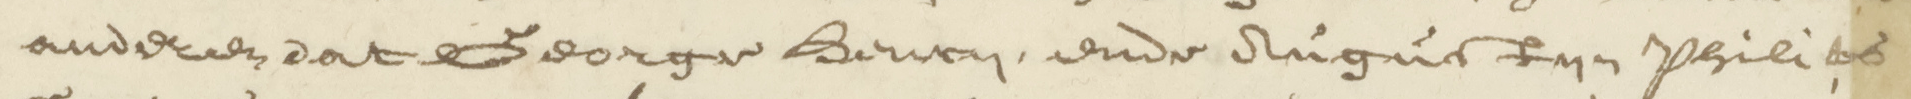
anderen dat George Henry, ende Augustyn Philips
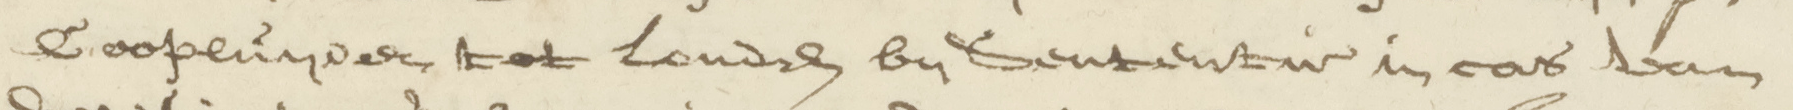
coopluyden tot Londen bij sententie in cas van
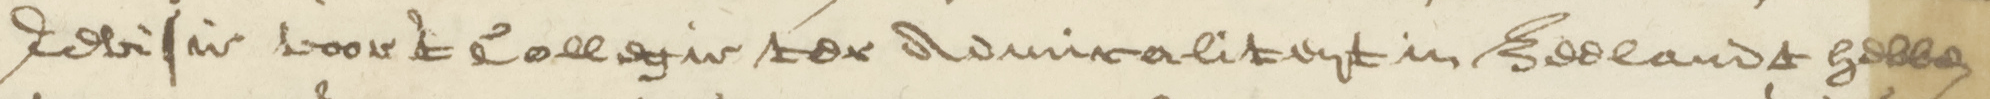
revisie voort Collegie ter Admiraliteyt in Zeelandt hebben
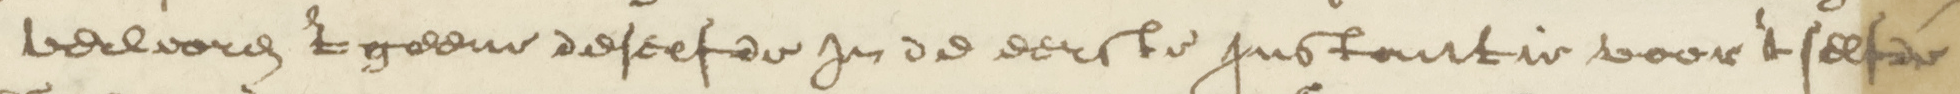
verlooren 't geene deselfde in de eerste instantie voor 't selfde
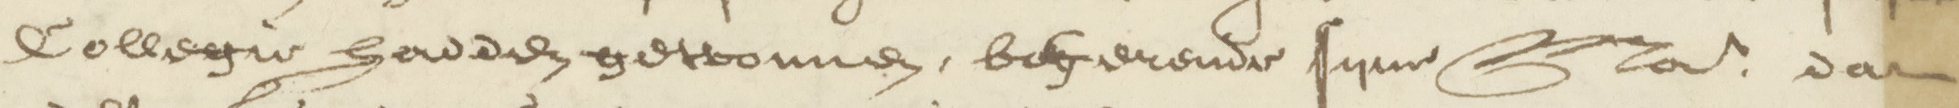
Collegie hadden gewonnen, begerende Sijne Mat dat
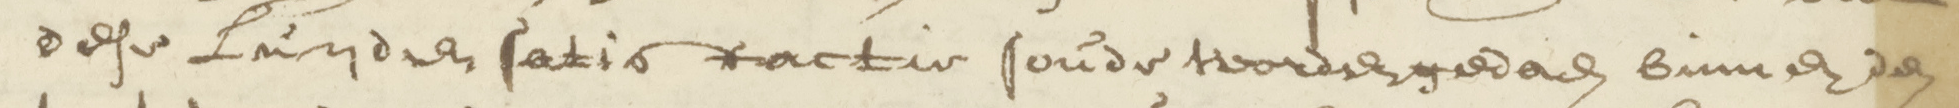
dese Landen satisfactie soude worden gedaen binnen den
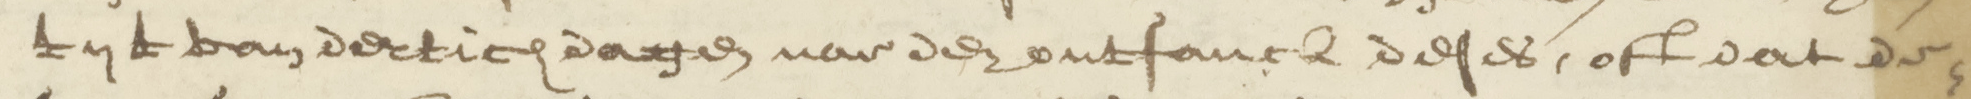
tyt van dertich dagen nae den ontfanck deses, off dat de
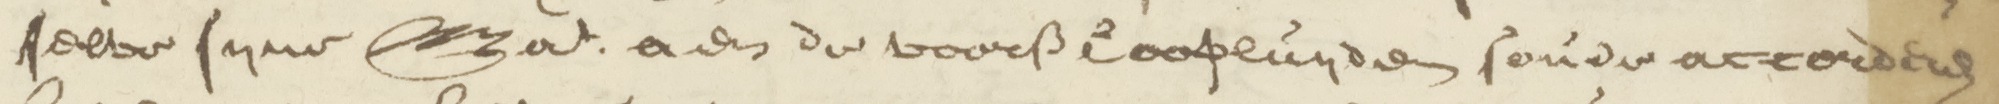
selve syne Mat aen de voors coopluyden soude accorderen
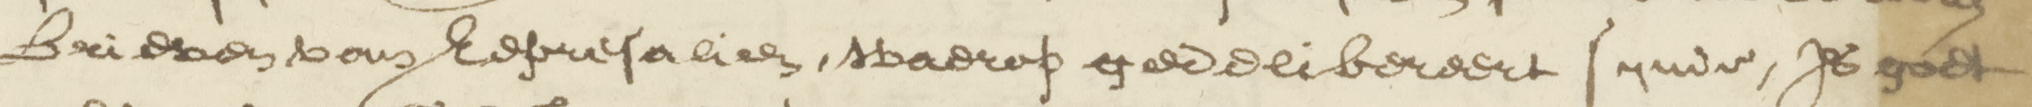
brieven van represalien, waerop gedelibereert synde, is goet
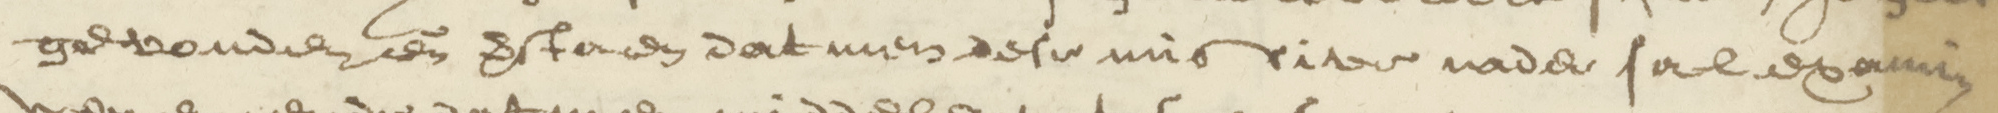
gevonden en verstaen dat men dese missive nader sal exami„
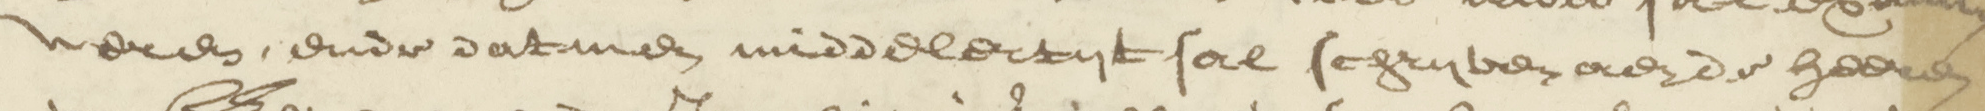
neren ende datmen middelertyt sal schryven aende heeren
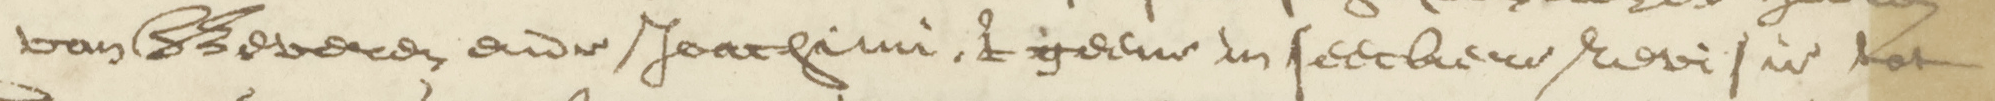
van Beveren ende Joachimi, t geene in seeckere revisie tot
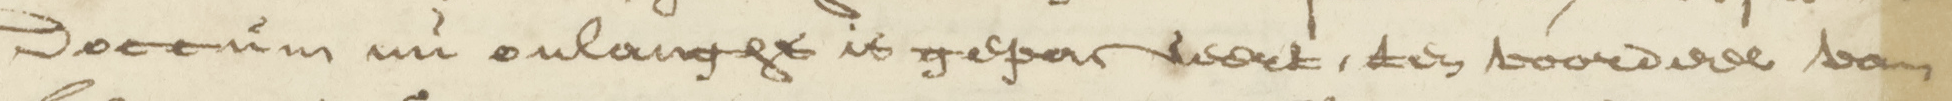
Doccum nu onlanghs is gepasseert, ten voordeel van
